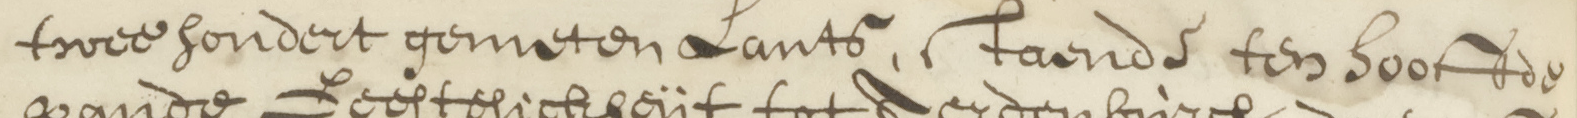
twee hondert gemeten Lants, staende ten hooffde
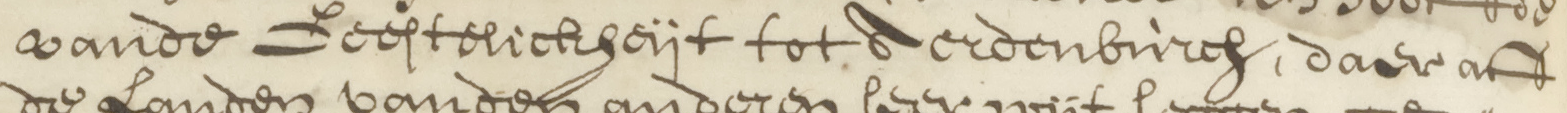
vande Geestelickheijt tot Aerdenburch, daer aff
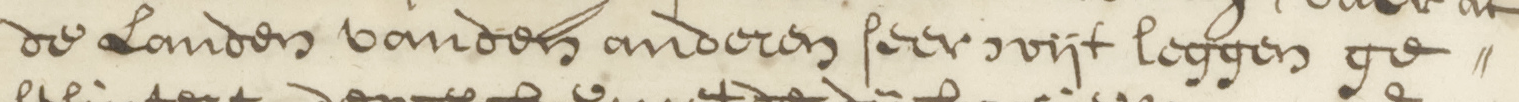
de Landen vanden anderen seer wijt leggen ge,,
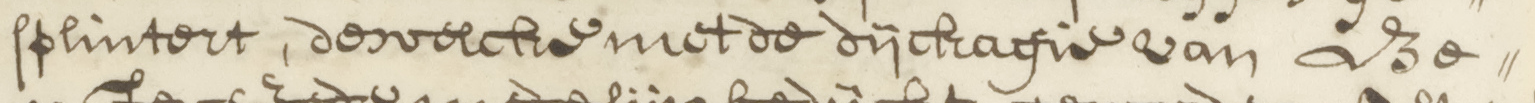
splintert, dewelcke met de dijckagie van Be,,
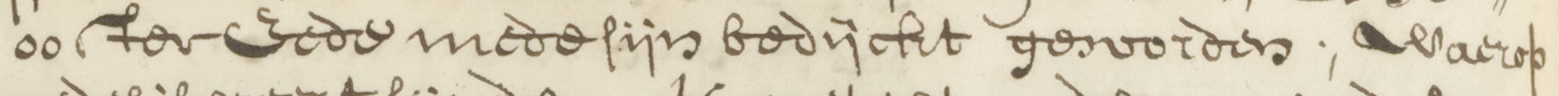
oosterEede mede sijn bedijckt geworden; Waerop
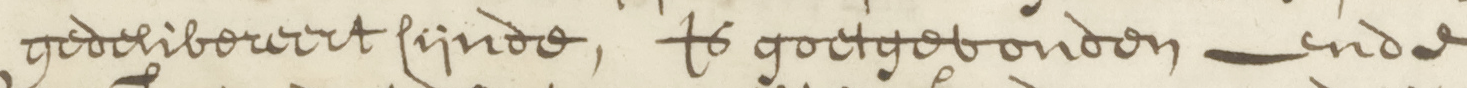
gedelibereert sijnde, Is goetgevonden ende
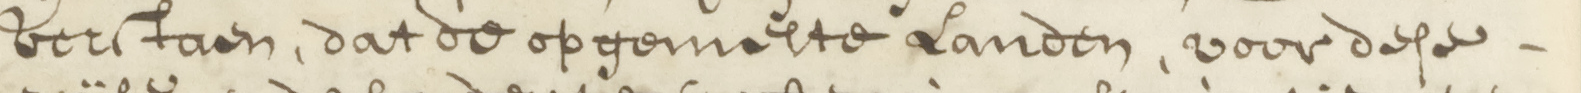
verstaen, dat de opgemelte Landen, voor dese -
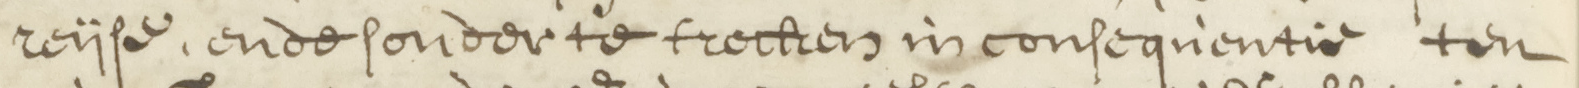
reijse, ende sonder te trecken in consequentie ten
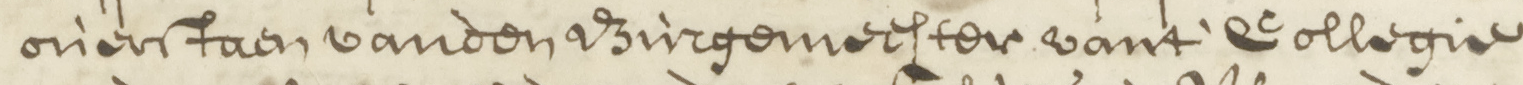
ouerstaen vanden Burgemeester vant' Collegie
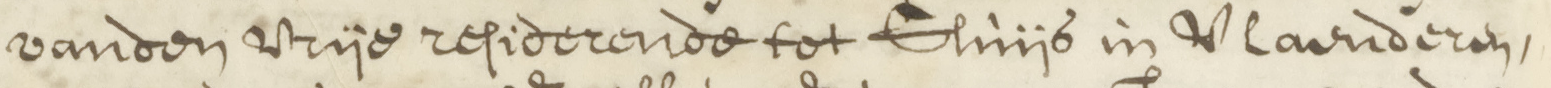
vanden Vrije residerende tot Sluijs in Vlaenderen,
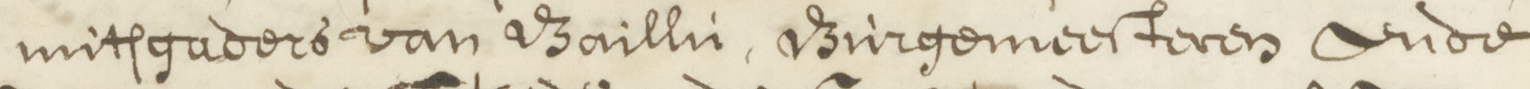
mitsgaders van Baillu, Burgemeesteren ende
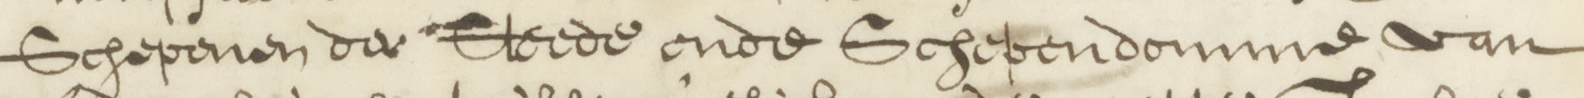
Schepenen der Steede ende Schependomme van
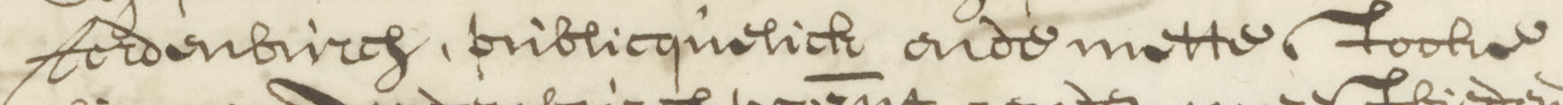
Aerdenburch, publicquelick ende mette stooke
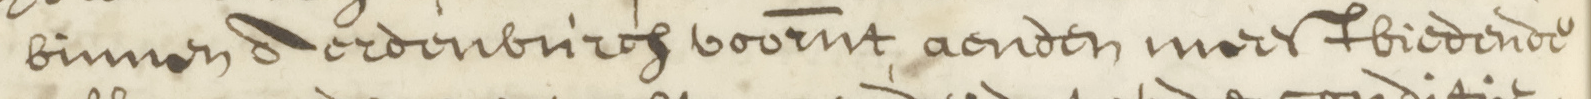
binnen Aerdenburch voornt aenden meestbiedende
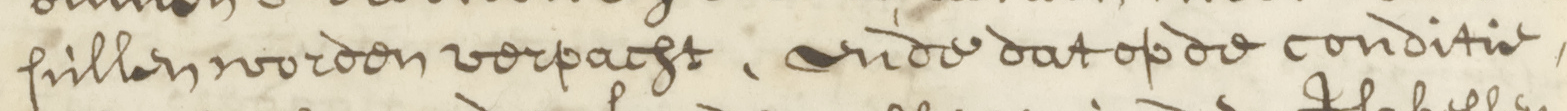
sullen worden verpacht, ende dat op de conditie,
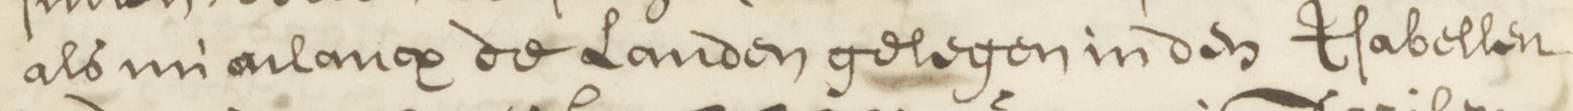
als nu onlancx de Landen gelegen in den Isabellen
